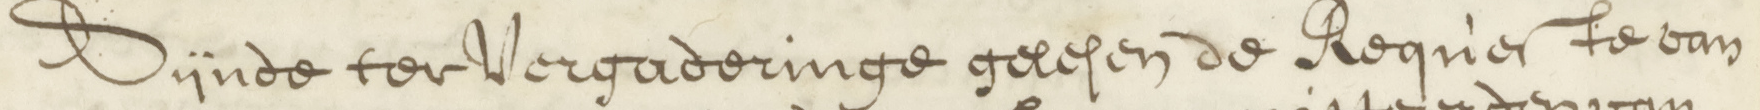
Sijnde ter Vergaderinge gelesen de Requeste van
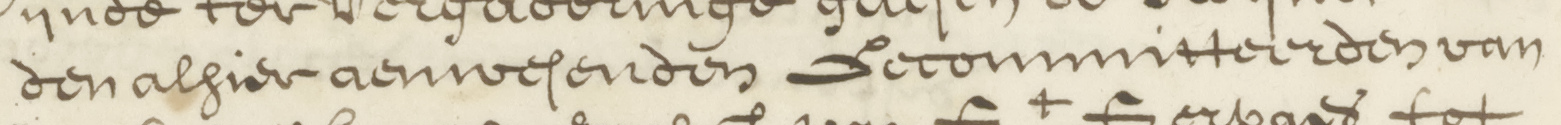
den alhier aenwesenden Gecommitteerden van
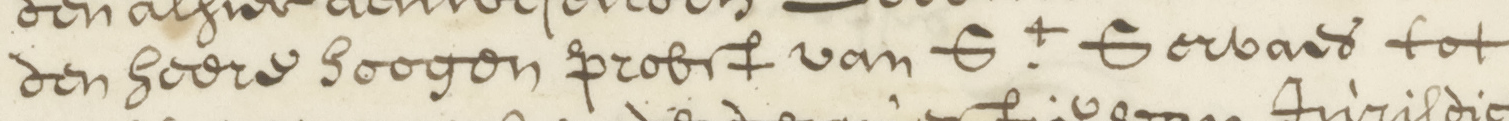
den heere hoogen probst van St. Servaes tot
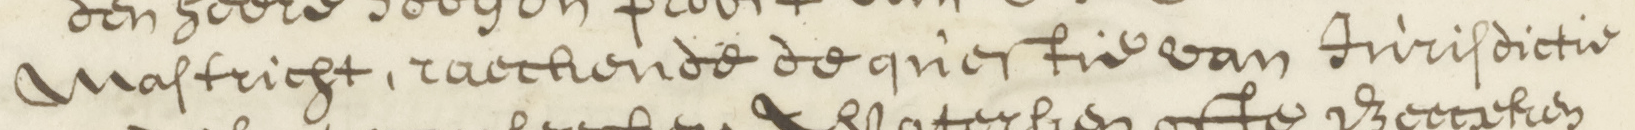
Mastricht, raeckende de questie van Jurisdictie
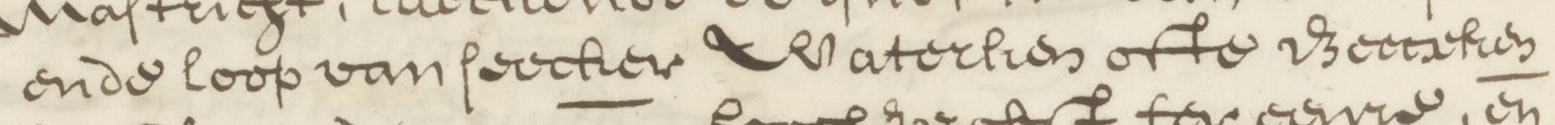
ende loop van seecker Waterlien ofte Beecxken
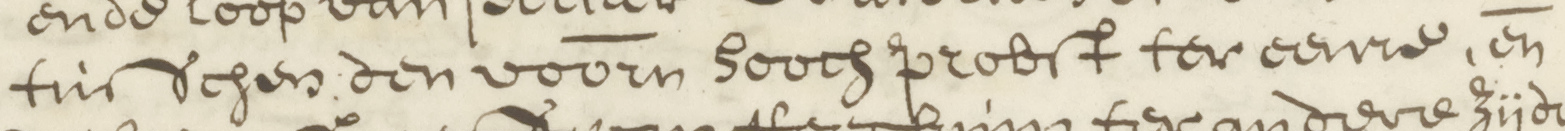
tusschen den voorn hooch probst ter eenre, en
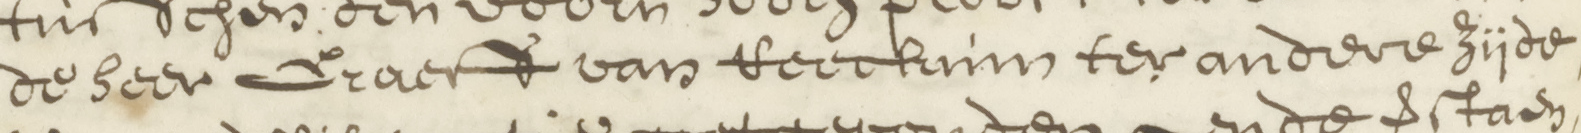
de heer Graeff van Reeckum ter andere zijde;
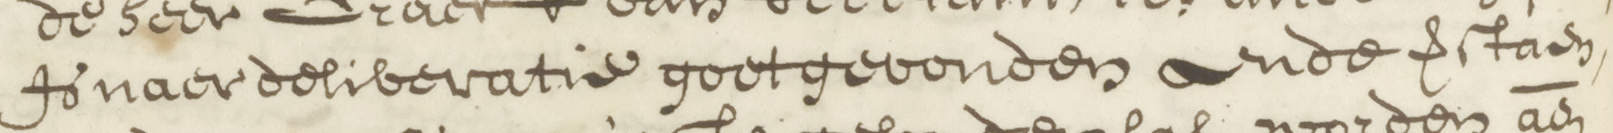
Is naer deliberatie goetgevonden ende vstaen,
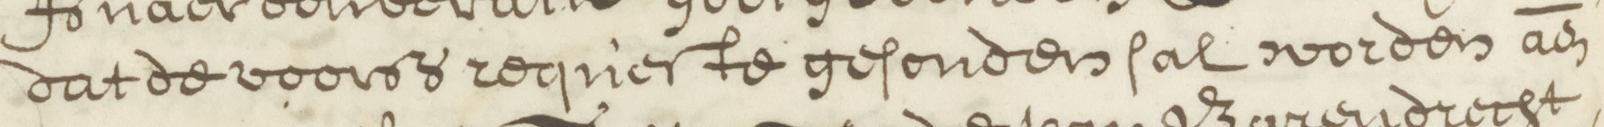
dat de voors requeste gesonden sal worden aen
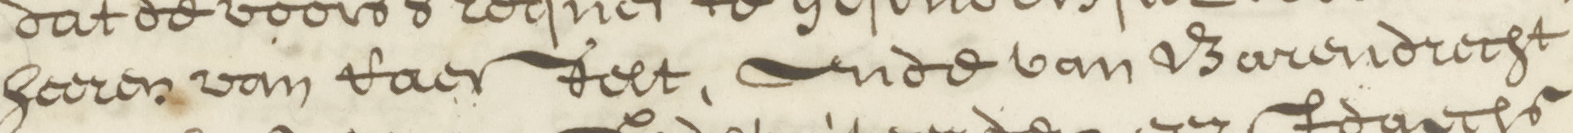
heeren van Raesfelt, ende van Barendrecht
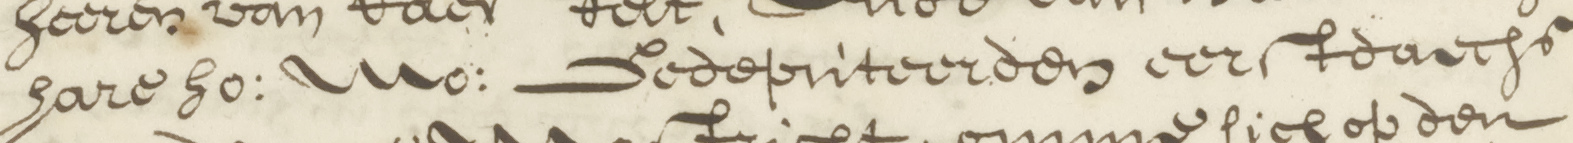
hare ho:Mo: Gedeputeerden eerstdaechs
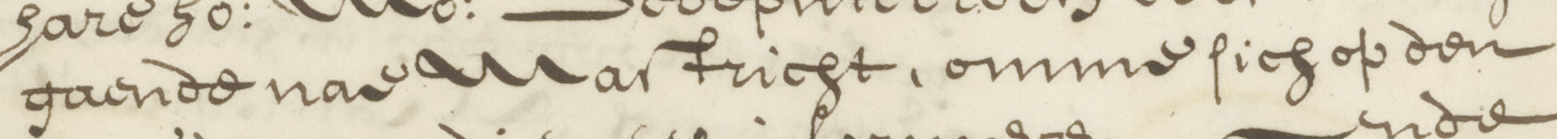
gaende nae Mastricht, omme sich op den
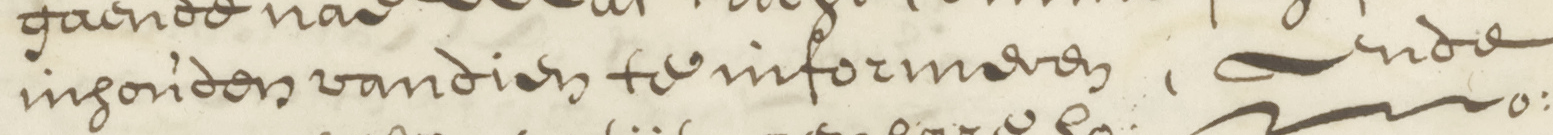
inhouden vandien te informeren, ende
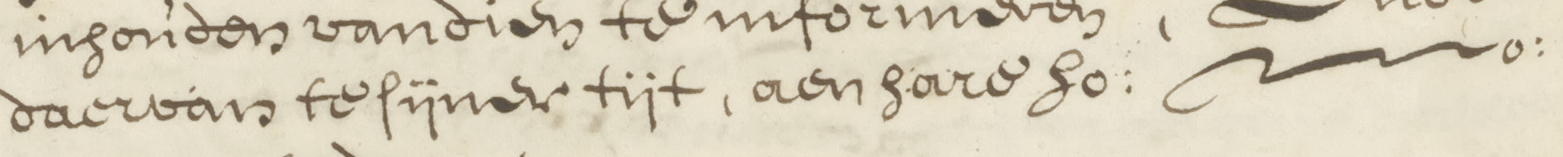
daervan te sijner tijt, aen hare ho:Mo:
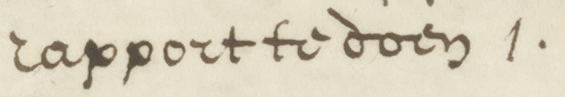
rapport te doen.
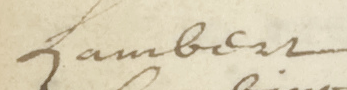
Lambert
